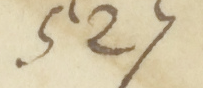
527
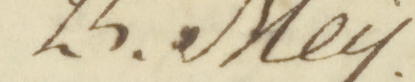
25. Meij.
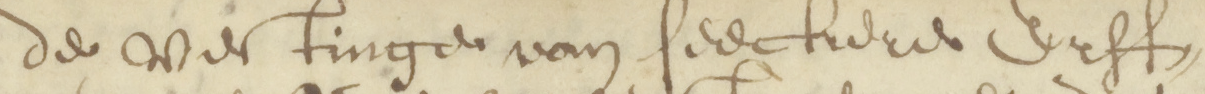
de Vestinge van seeckere Erff„
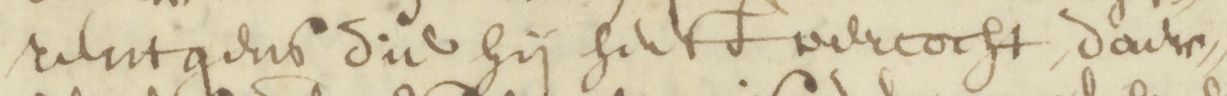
rentgens die hij heeft vercocht, daer„
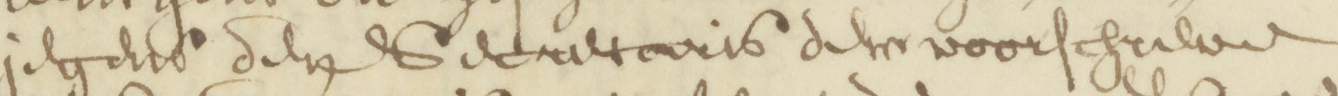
jegens den Secretaris der voorschreve
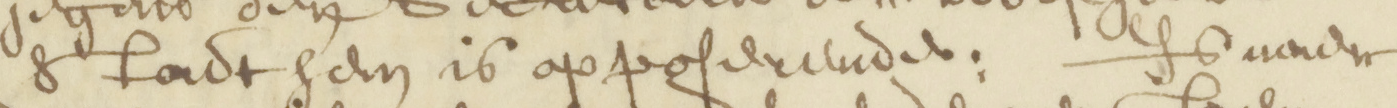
Stadt hem is opposerende: Is naer
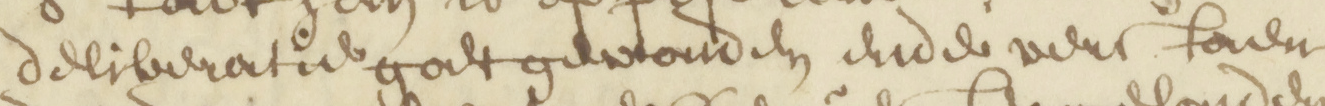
deliberatie goetgevonden ende verstaen,
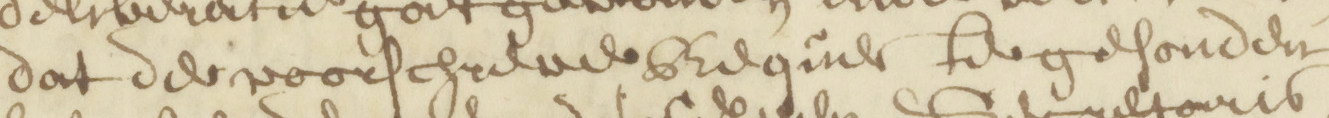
dat de voorschreve Requeste gesonden
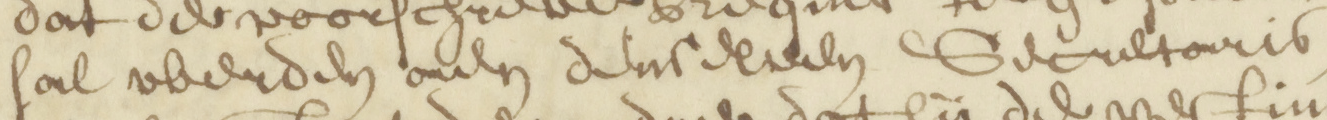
sal werden aen denselven Secretaris,
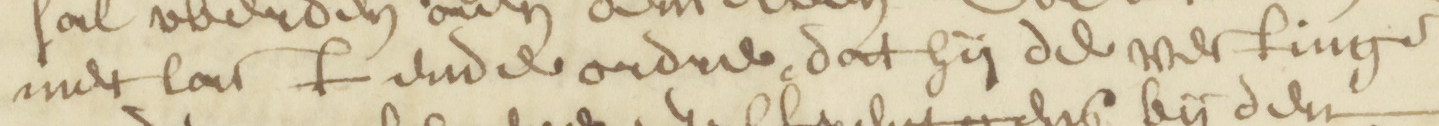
met last ende ordre, dat hij de Vestinge
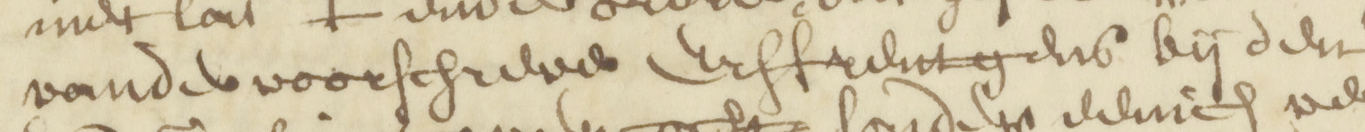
vande voorschreve Erffrentgens bij den
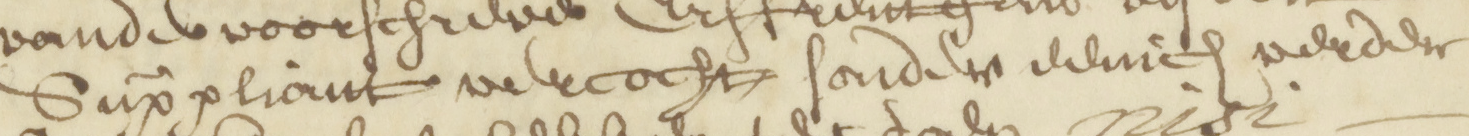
Suppliant vercocht, sonder eenich verder
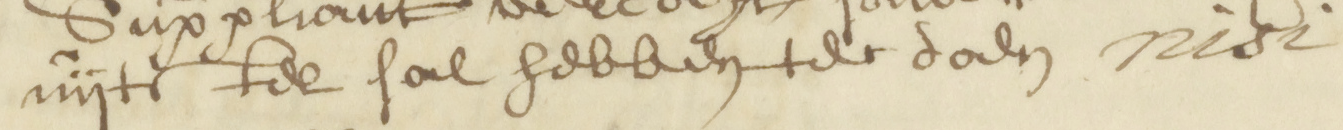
uijtstel sal hebben te doen nisi
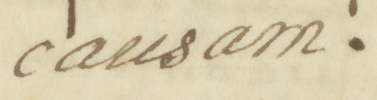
causam.
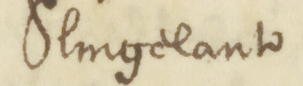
Slingelant
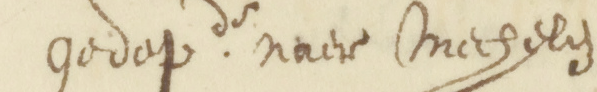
gedepden. naer Mechelen
